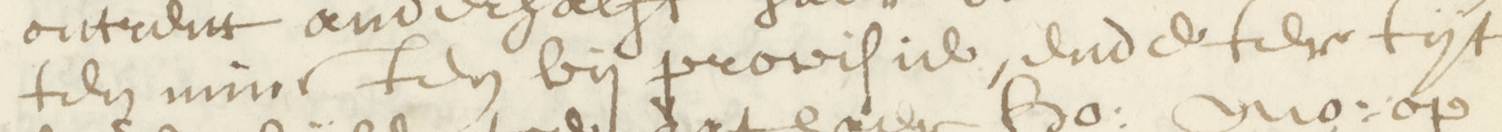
ten minsten bij provisie, ende ter tijt
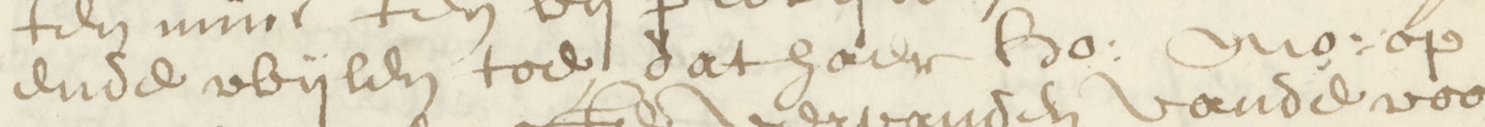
ende wijlen toe dat haer Ho:Mo: op
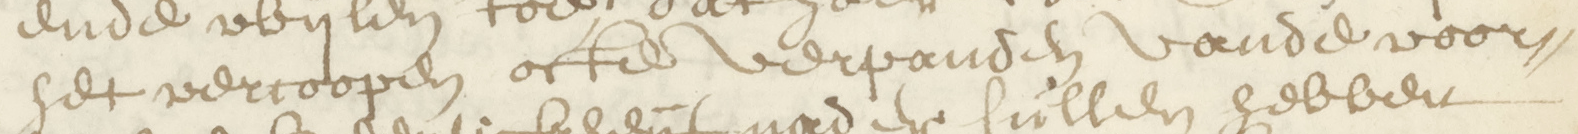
het vercoopen ofte verpanden vande voor„
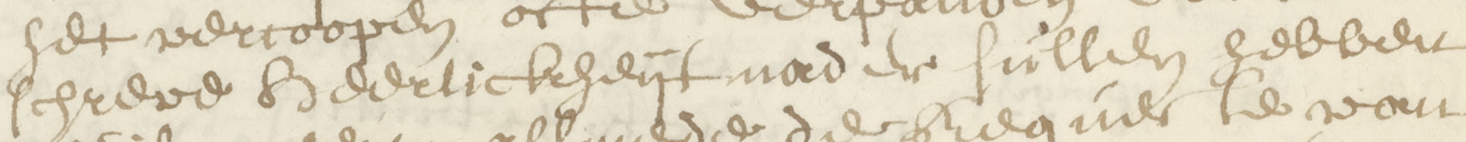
schreve Heerlickheijt nader sullen hebben
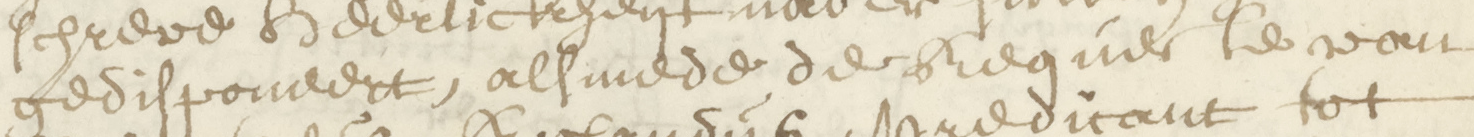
gedisponeert, alsmede de Requeste van
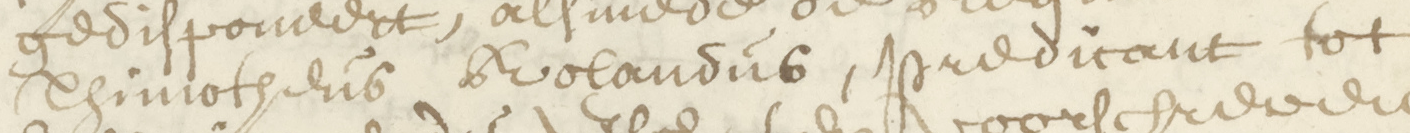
Thimotheus Rolandus, Predicant tot
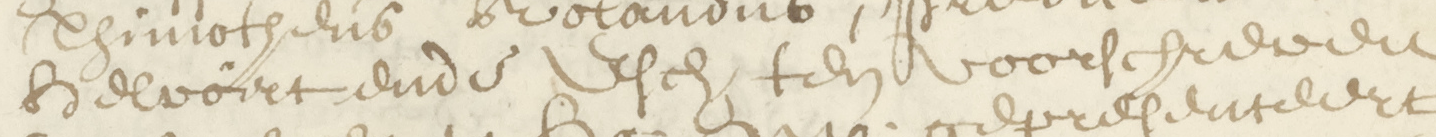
Helvoirt ende Esch, ten voorschreven
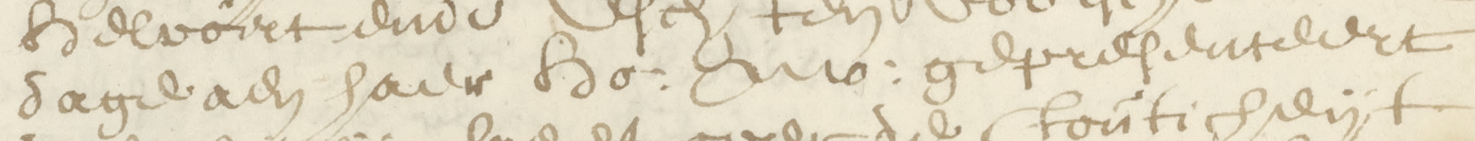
dage aen haer Ho:Mo: gepresenteert,
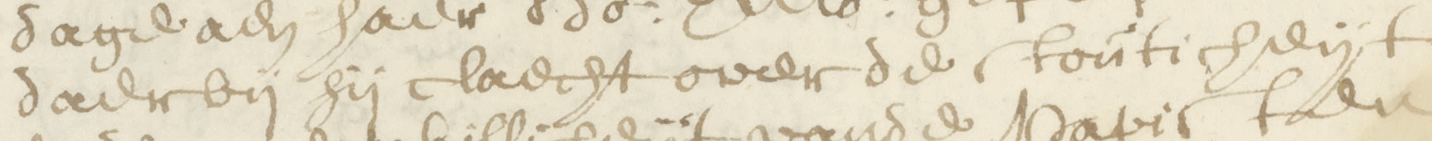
daerbij hij claecht over de stouticheijt
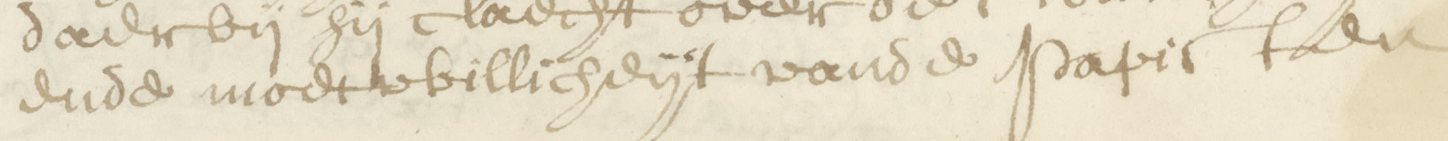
ende moetwillicheijt vande Papisten
